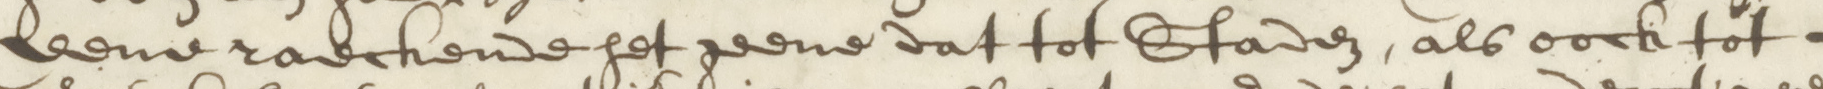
eene raeckende het geene dat tot Staden, als oock tot
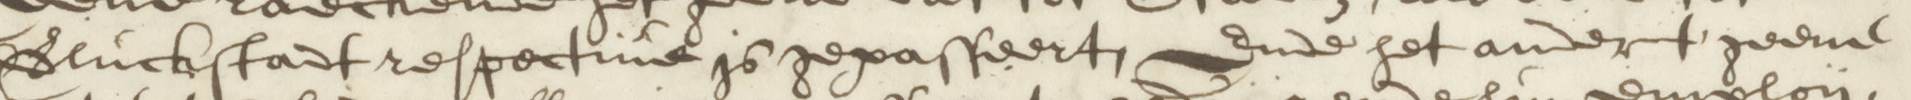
Gluckstadt respectiue is gepasseert. Ende het ander t'geene
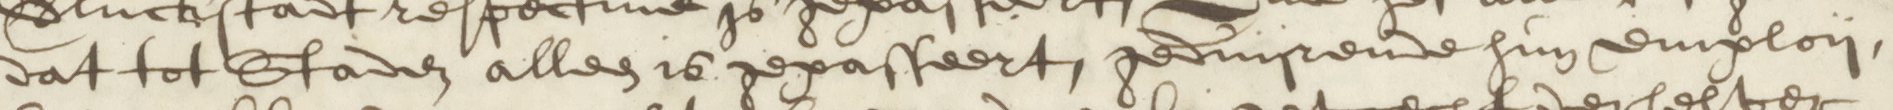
dat tot Staden alleen is gepasseert, geduijrende hun emploij.
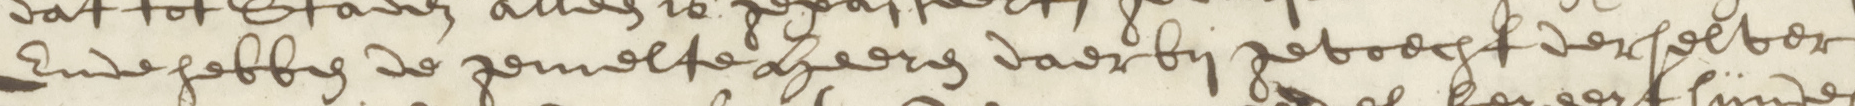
Ende hebben de gemelte heeren daerbij gevoecht derselver
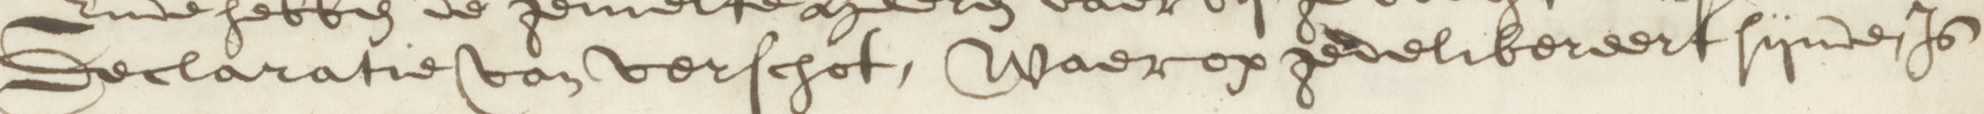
declaratie van verschot. Waerop gedelibereert sijnde, Is
